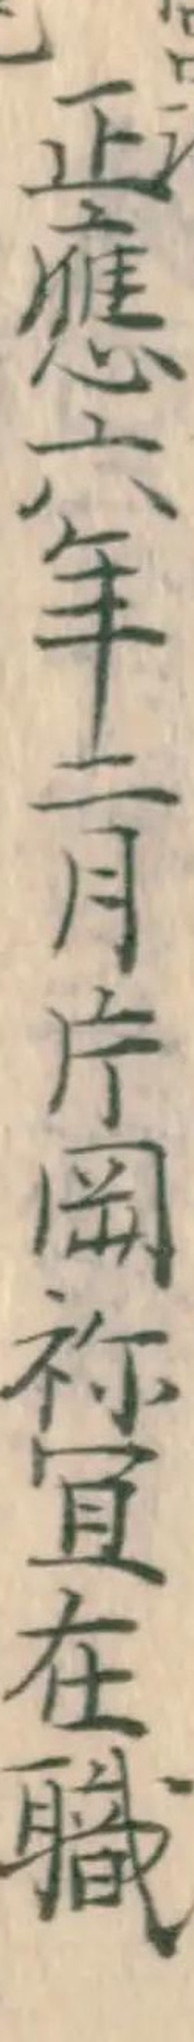正応六年二月片岡祢宜在職
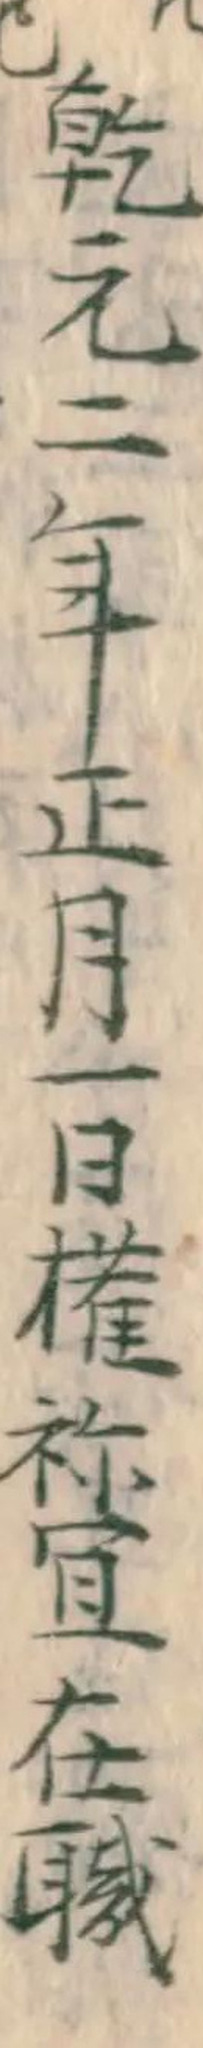乾元二年正月一日権祢宜在職
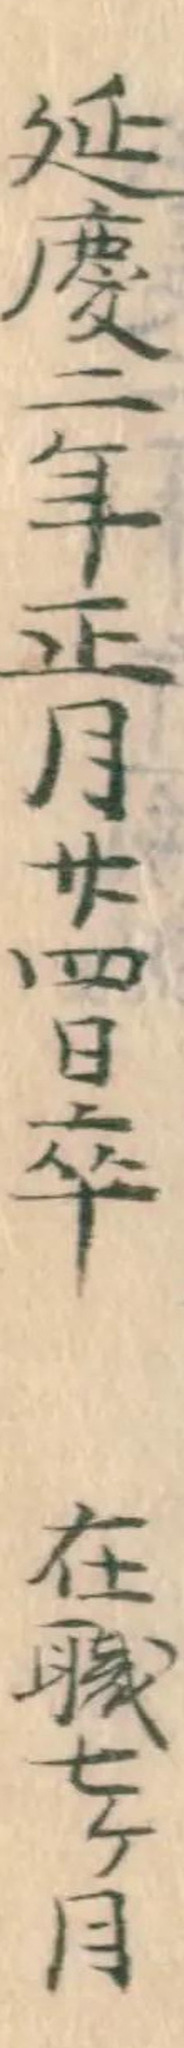延慶二年正月廿四日卒在職七ヶ月
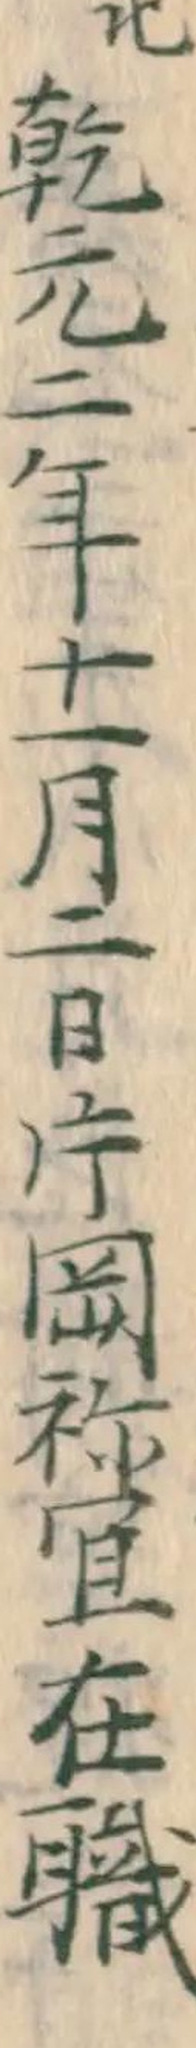乾元二年十一月二日片岡祢宜在職
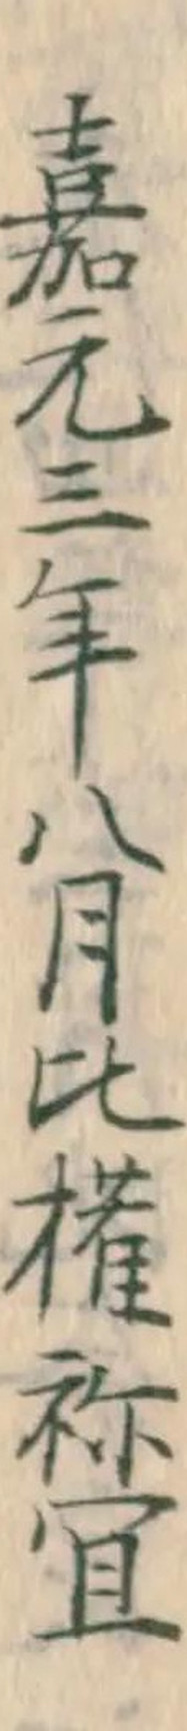嘉元三年八月比権祢宜
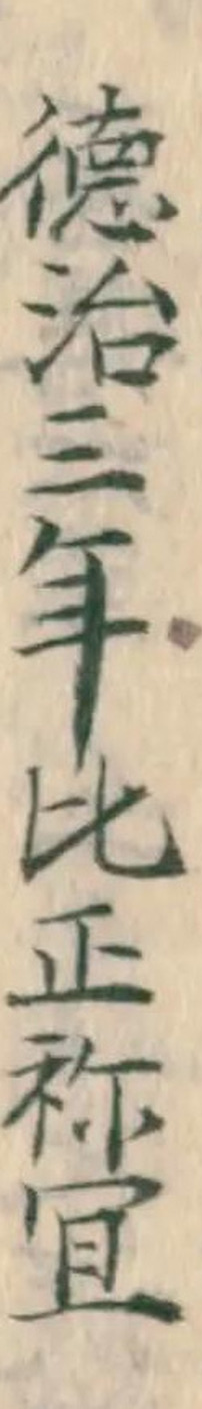徳治三年比正祢宜

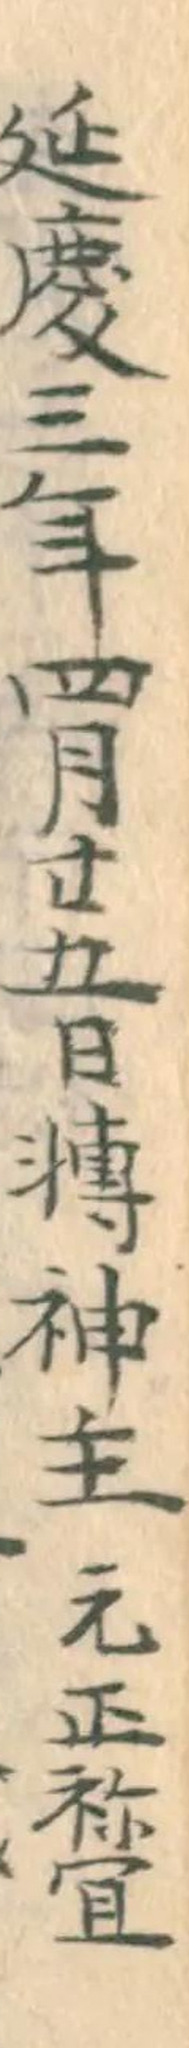延慶三年四月廿五日転神主元正祢宜
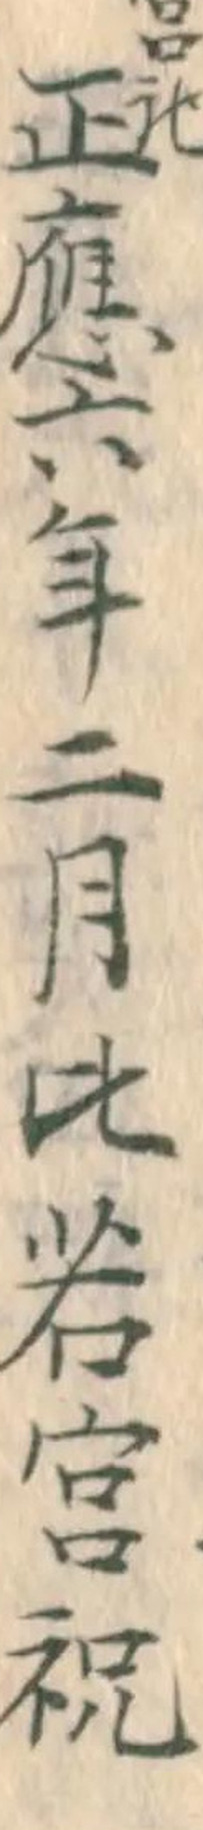正応六年二月比若宮祝
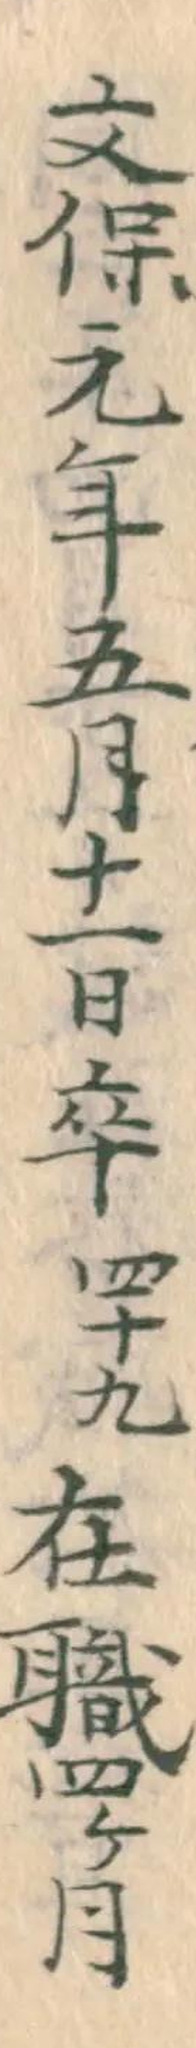文保元年五月十一日卒四十九在職四ヶ月
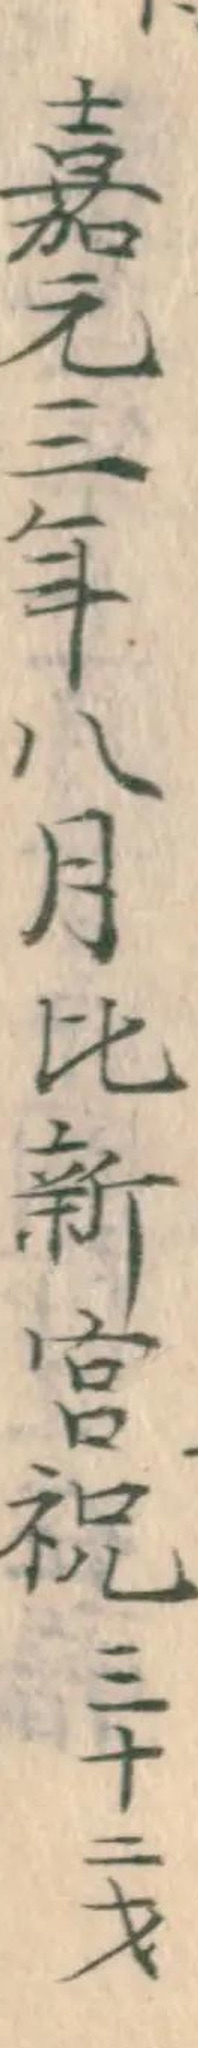嘉元三年八月比新宮祝三十二才
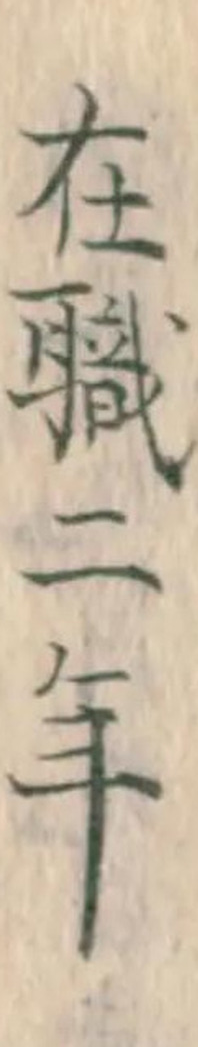在職二年
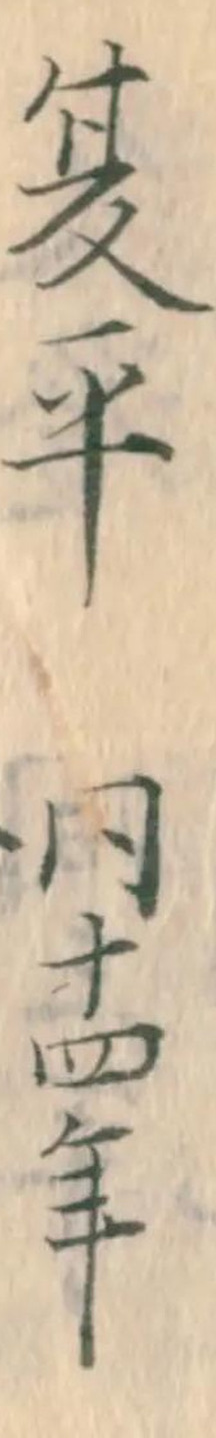夏平同十四年
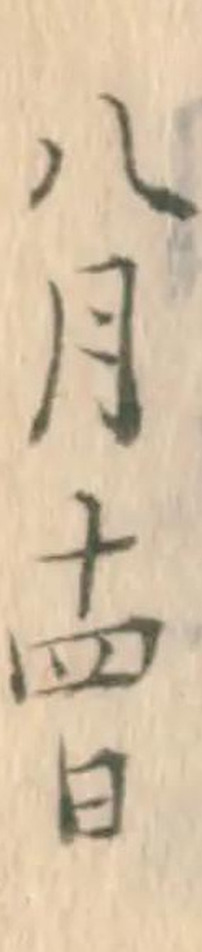八月十四日
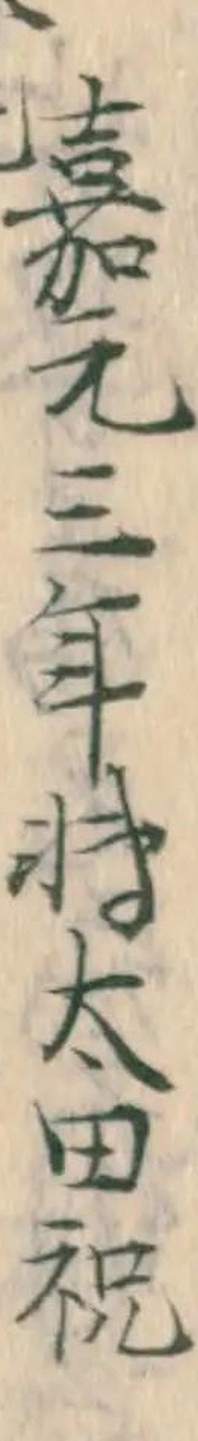嘉元三年転太田祝
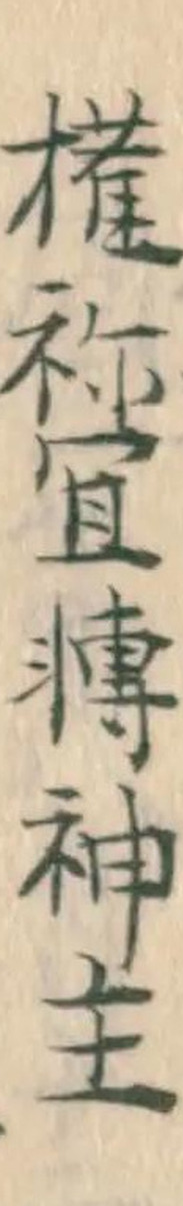権祢宜転神主
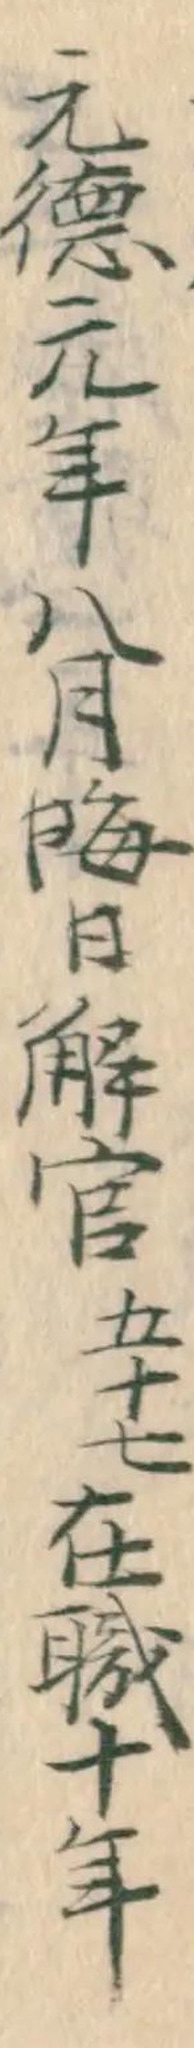元徳元年八月晦日解官五十七在職十年
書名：賀茂社記録. 第23冊
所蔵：国立国会図書館 National Diet Library, JAPAN
